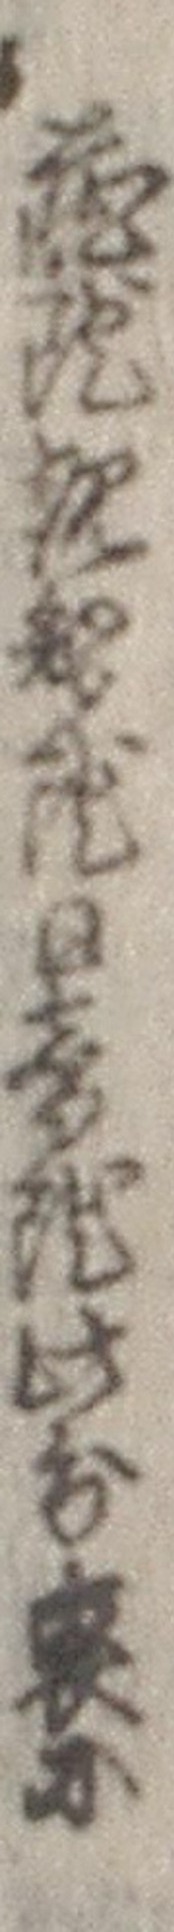蔵院観智院日寿院此分裏に
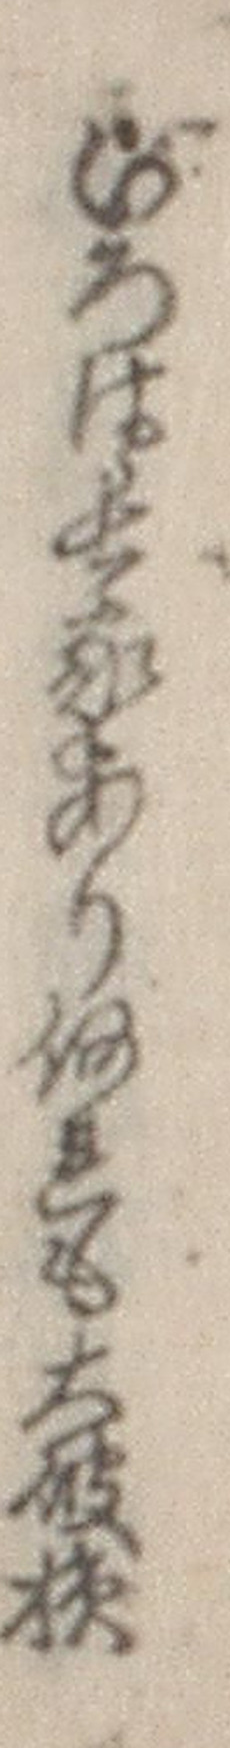いろは長家あり何れも大破損
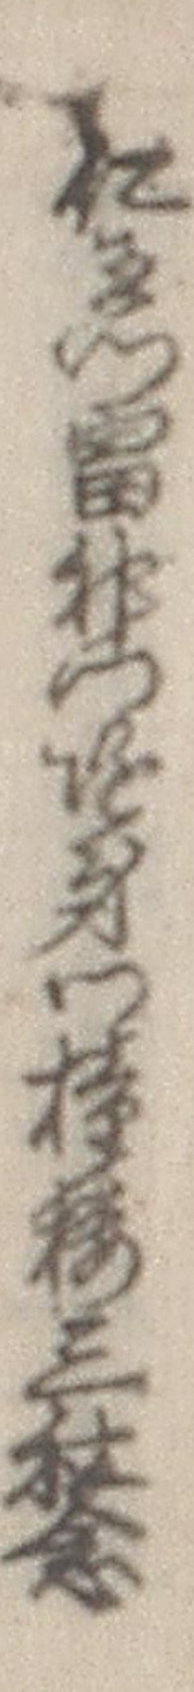仁王門雷神門随身門橦楼三社念
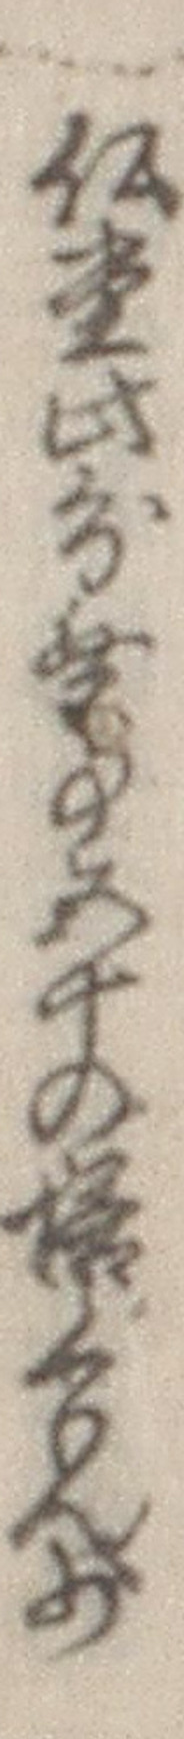仏堂此分無事五十の塔くりん少
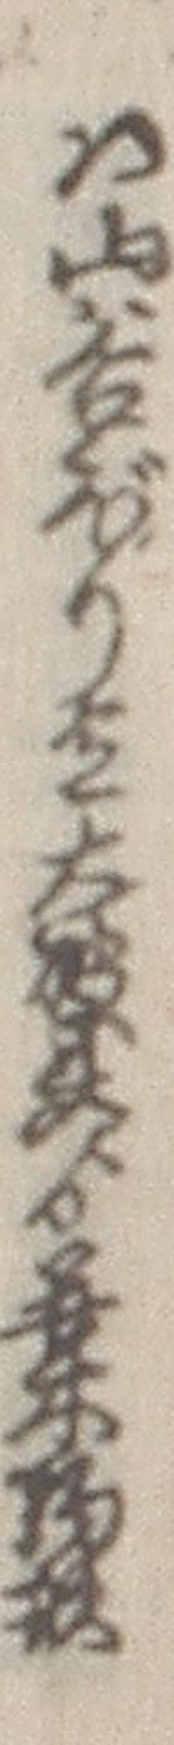は山谷ぼり迄大破夫ゟ並木駒形
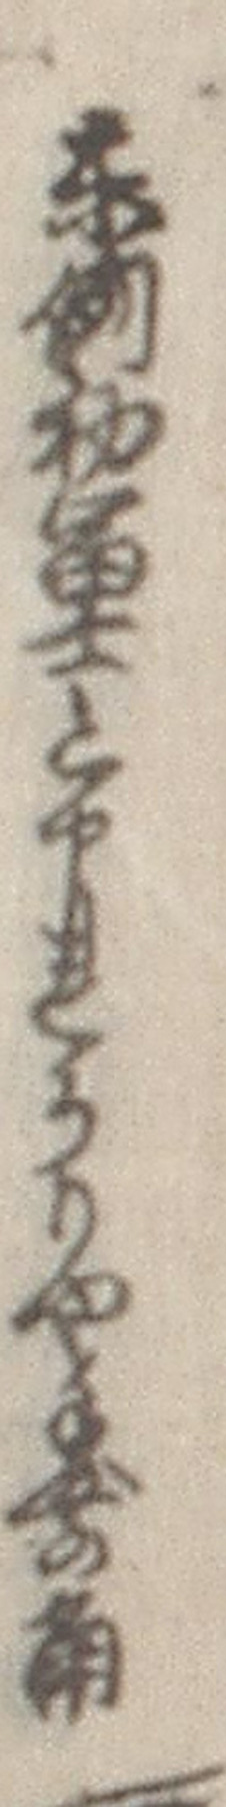東側初富士と申れうりや手前の角
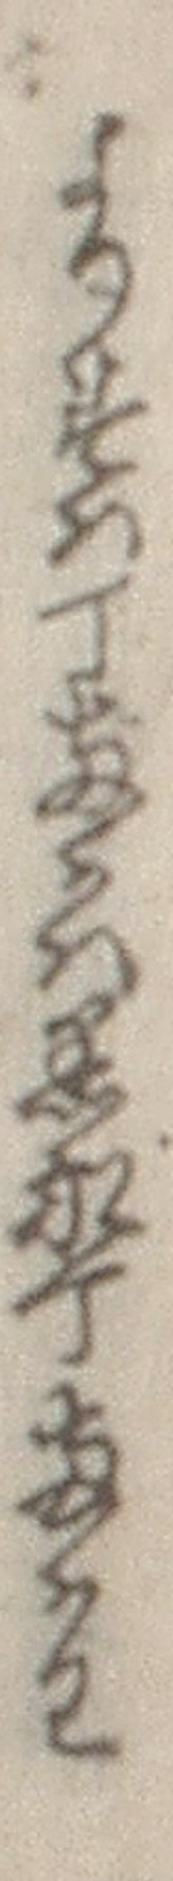よりすは丁両かは黒船丁両かわ
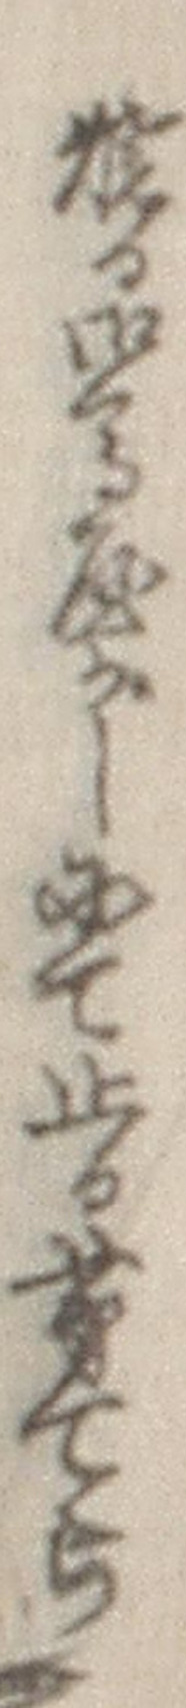焼る御馬屋がしにて止る茅てら
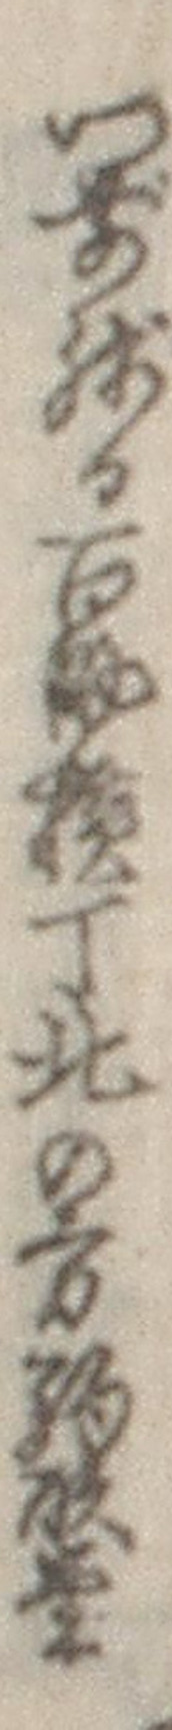門前残る百筋横丁北の方駒形堂
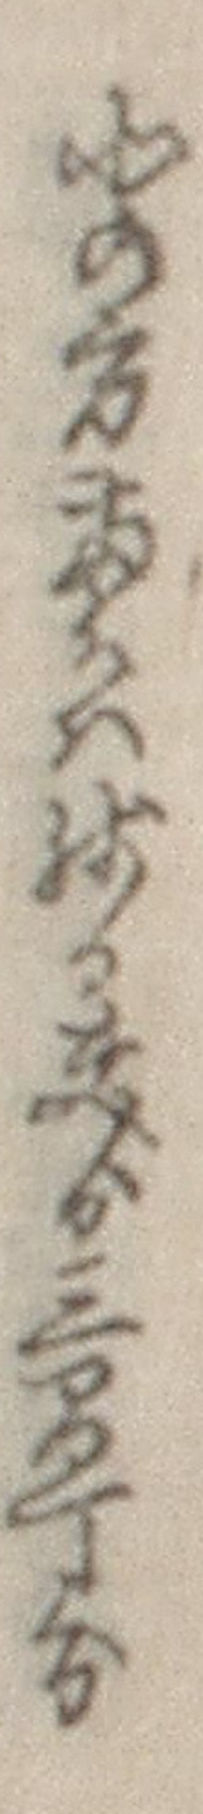北の方両かは残る夫ゟ三間丁分
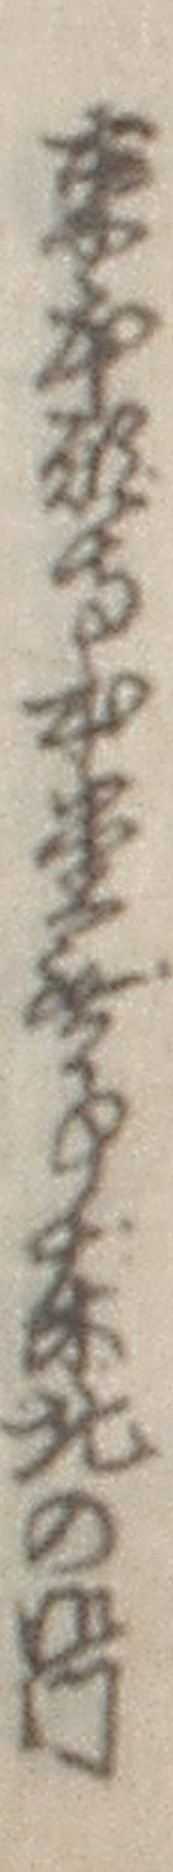東本願寺本堂無事東北の御門
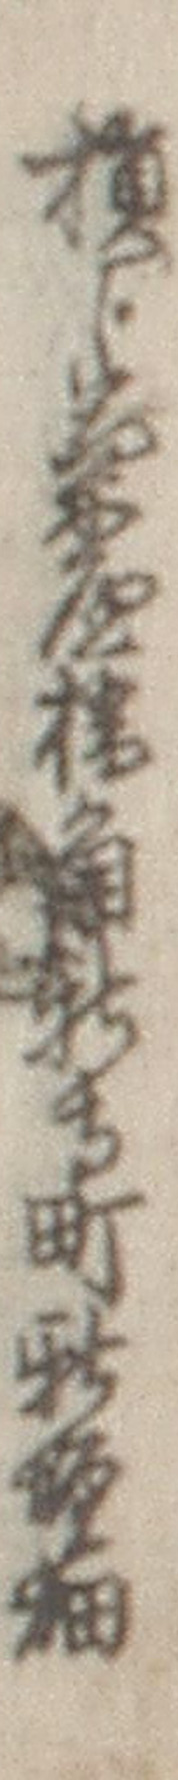損じ菊屋橋角新寺町新野畑
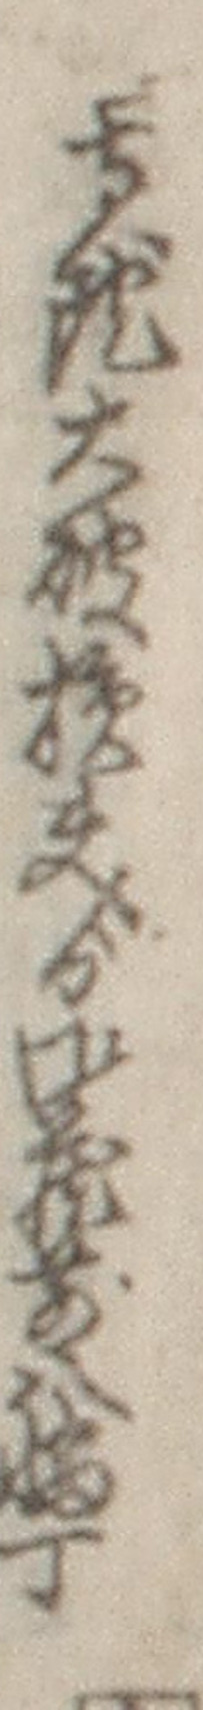寺院大破損夫ゟ御蔵前八幡丁
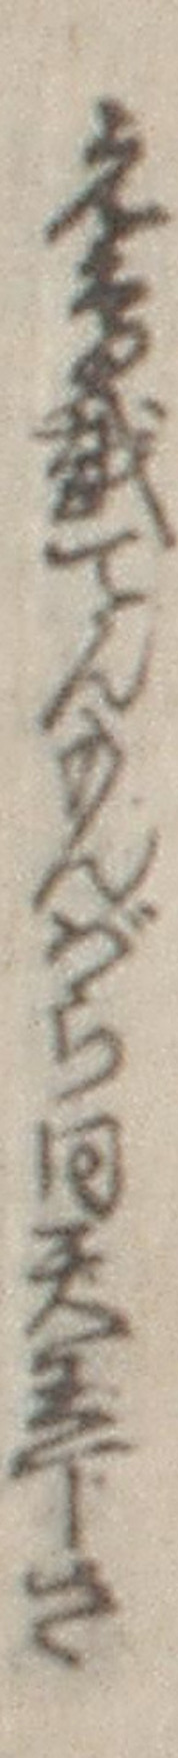元鳥越てんもんばら同天王下さ
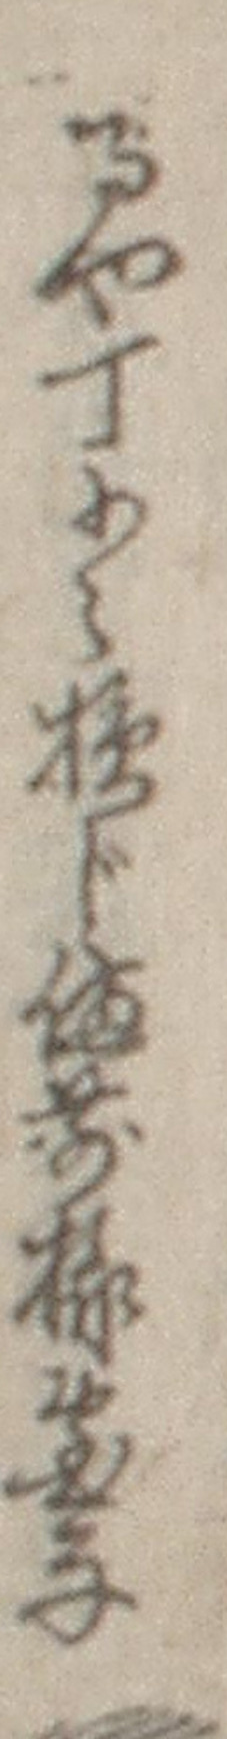るや丁少々損じ備前様団子
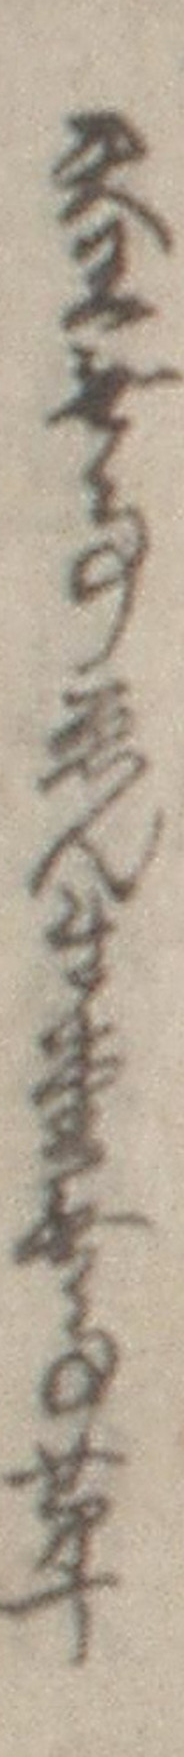天王無事ゑんま堂無事茅丁
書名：江戸　大地震臣細録　全
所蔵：東京大学地震研究所図書室 Earthquake Research Institute Library, The University of Tokyo, JAPAN
